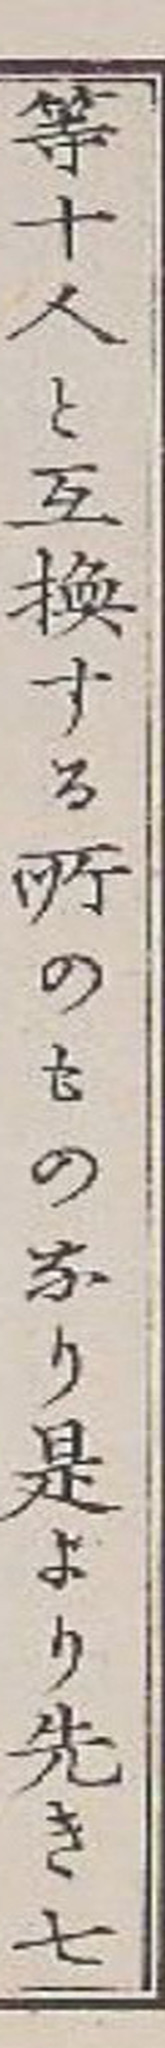等十人と互換する所のものなり是より先き七
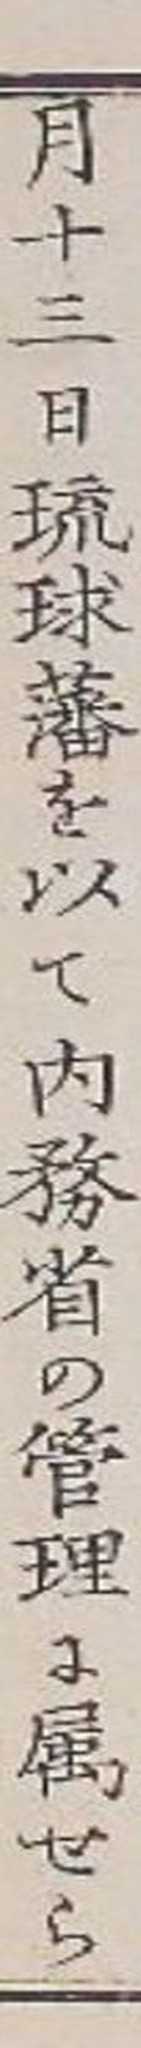月十三日琉球藩を以て内務省の管理に属せら
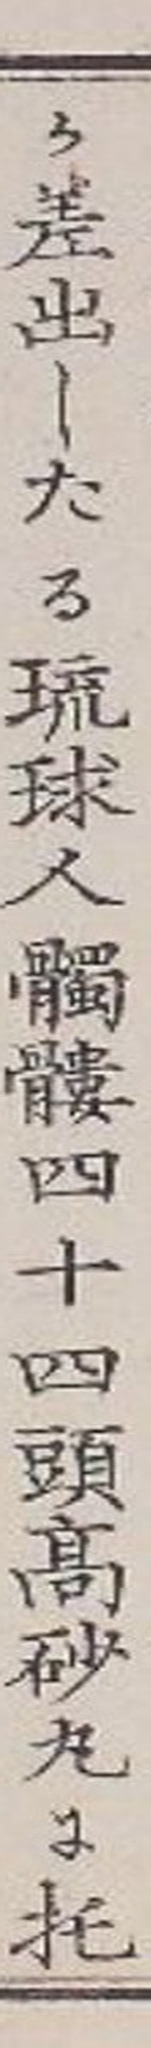か差出したる琉球人髑髏四十四頭高砂丸に托
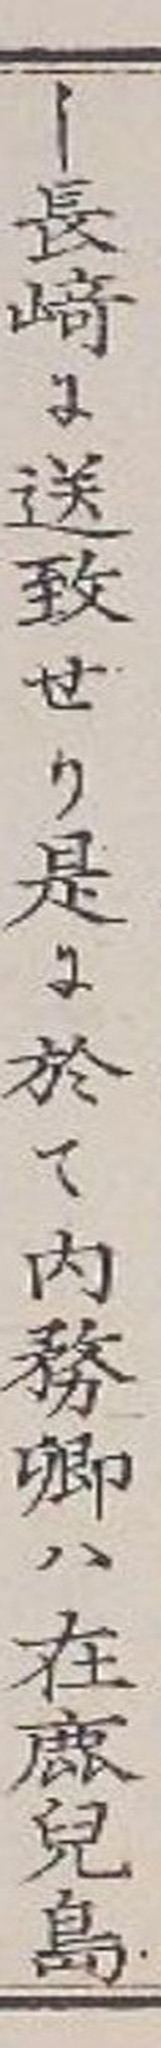し長崎に送致せり是に於て内務卿は在鹿児島
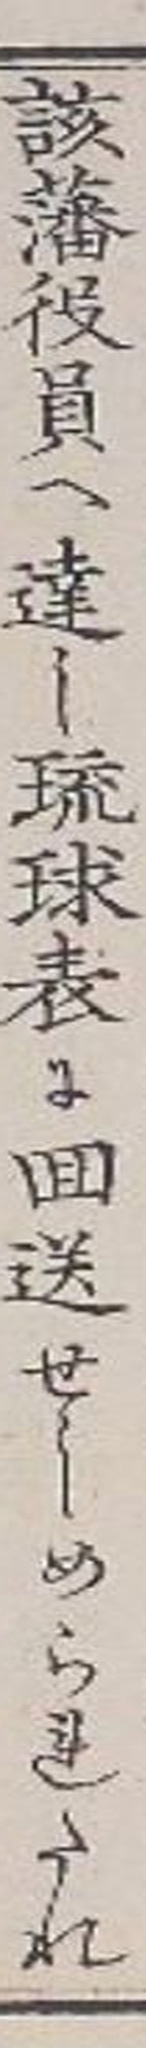該蕃役員へ達し琉球表に回送せしめられたれ
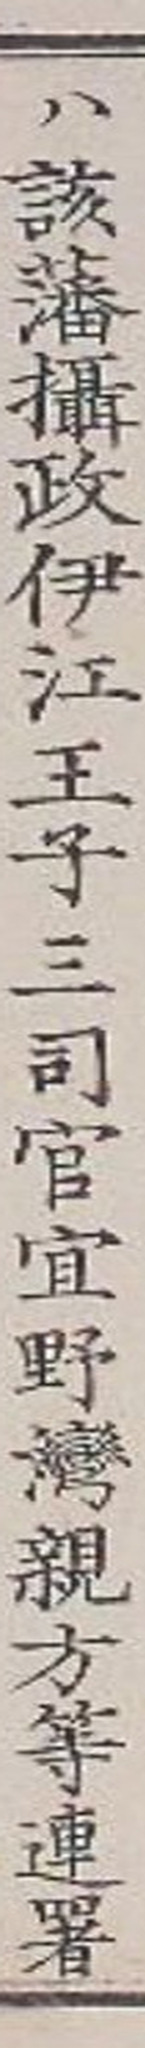は該地摂政伊江王子三司官宜野湾親方等連署
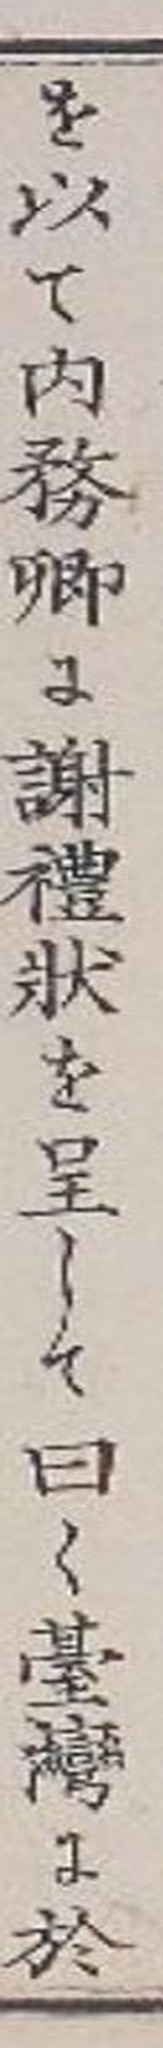を以て内務卿に謝礼状を呈して曰く台湾に於
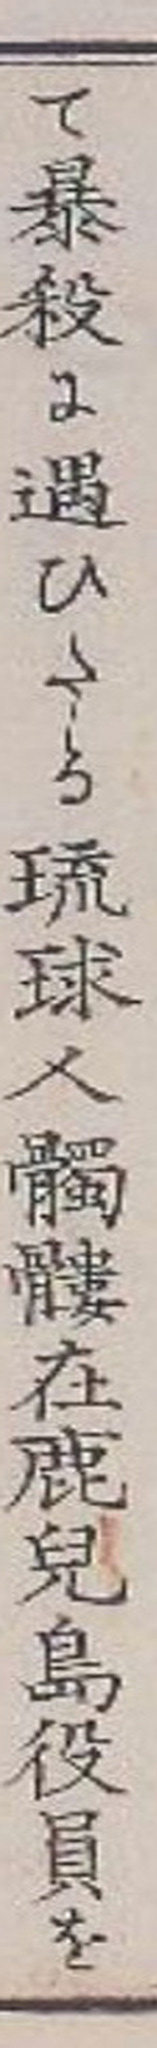て暴殺に遭ひたる琉球人髑髏在鹿児島役員を
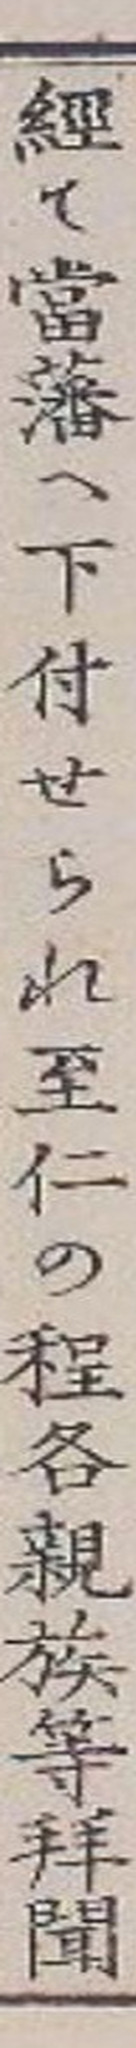経て当藩へ下付せられ至仁の程各親族等拝聞

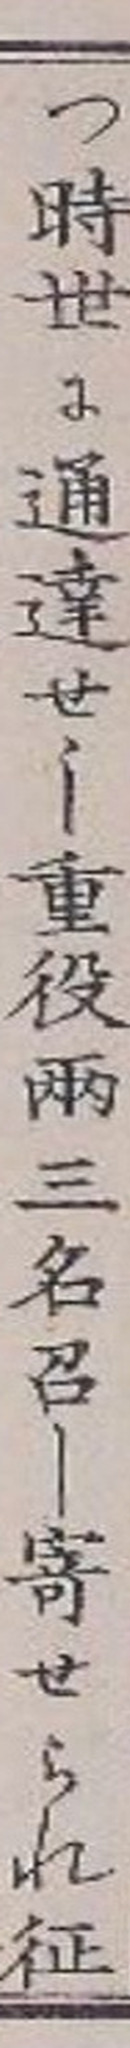つ時世に通達せし重役両三名召し寄せられ征
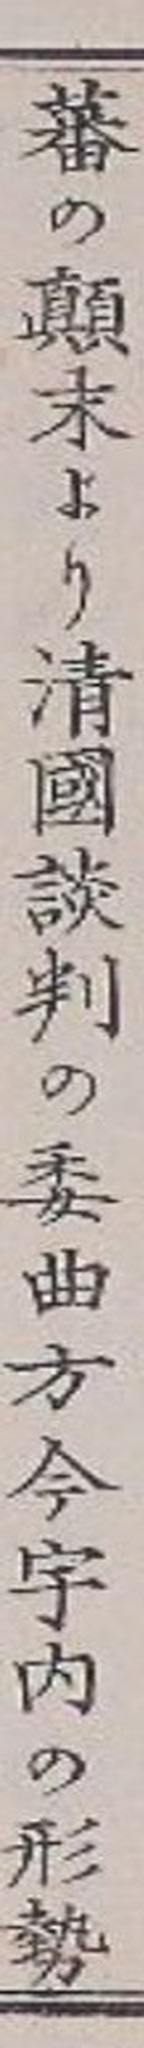蕃の顛末より清国談判の委曲方今宇内の形勢
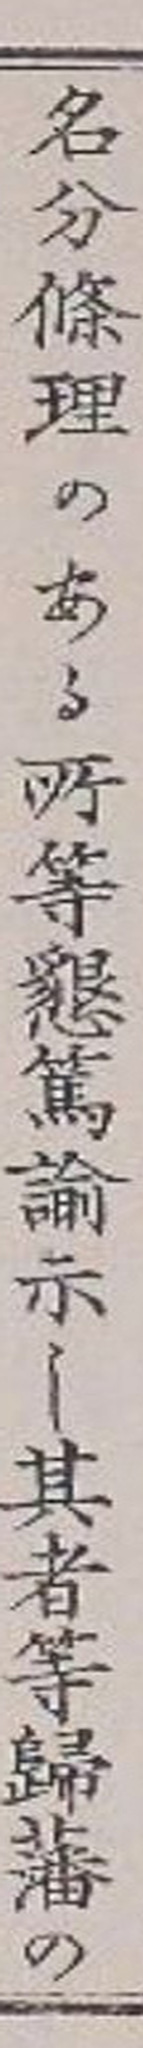名分条理のある所等懇篤諭示し其者等帰藩の
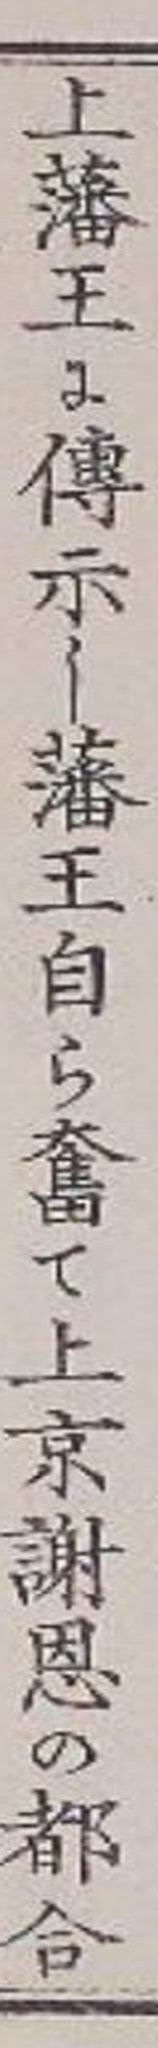上藩王に伝示し藩王自ら奮て上京謝恩の都合
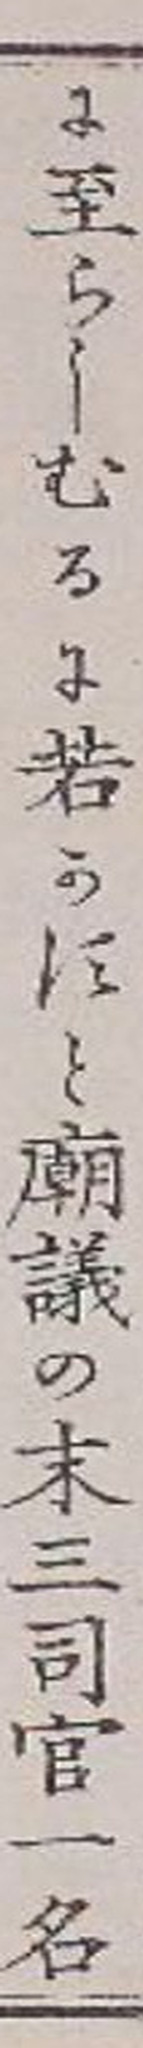に至らしむるに若かすと廟議の末三司官一名
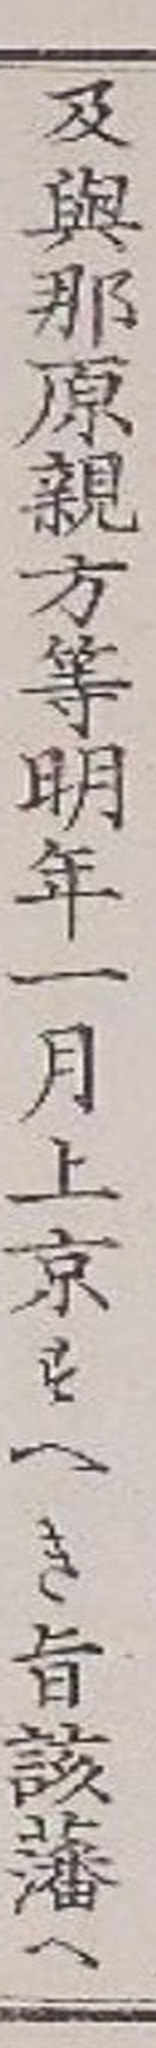及与那原親方等明年一月上京すへき旨該藩へ
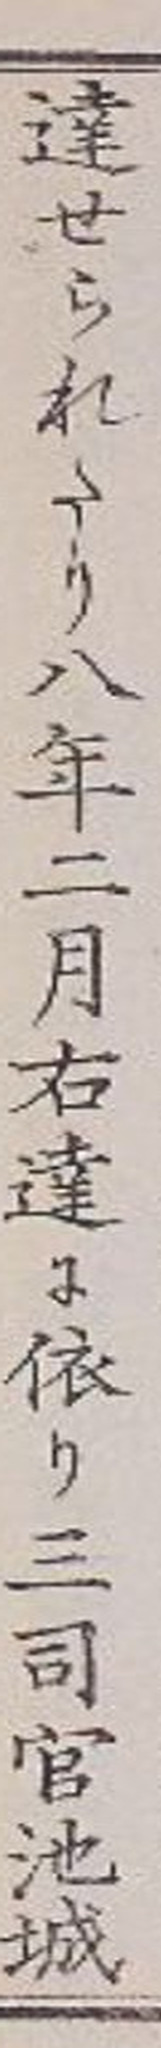達せられたり八月二月右達に依り三司官池城
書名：南島紀事 下
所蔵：University of the Ryukyus Library
